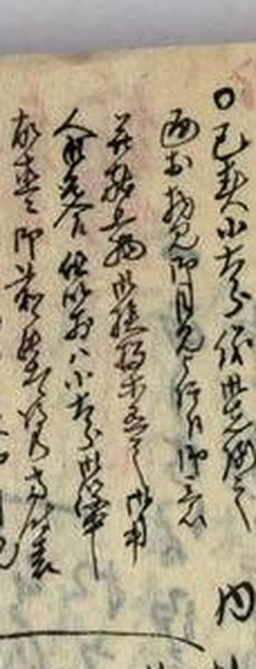幷献上物御挨拶等有之御用
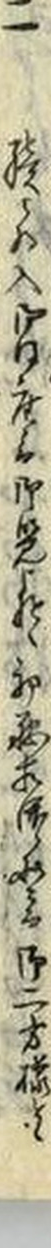続被為入御同座ニ而御覧被遊候初鞍相済候処ニ而御二方様とも
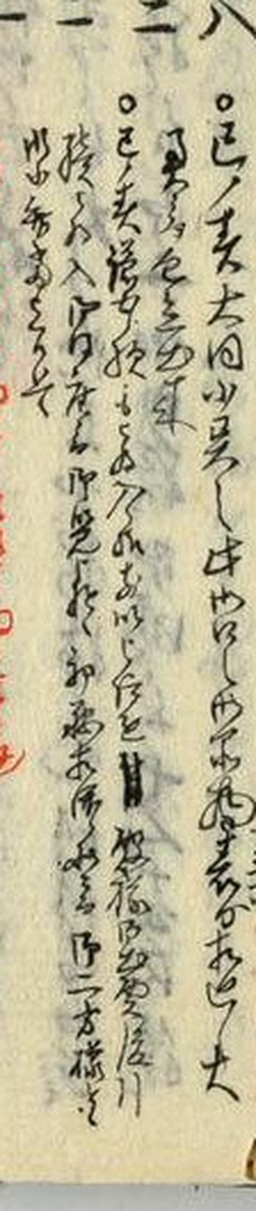〇己ノ春謙五郎様ニも被為入候様前以被仰進殿様御出殿後引
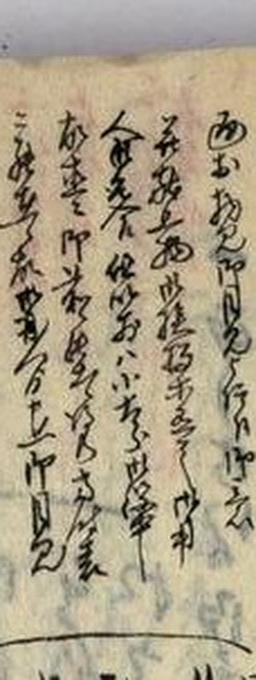人御取合但以前ハ小太郎御役中
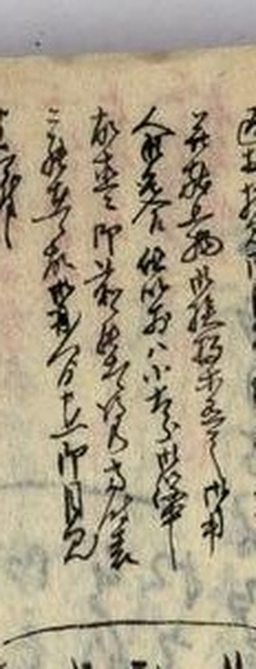故直ニ御前へ罷出候得共当時表
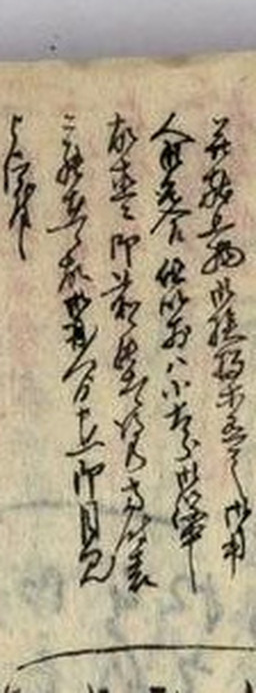故直ニ御前へ罷出候得共当時表
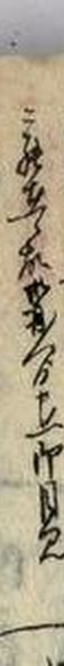ニ罷在候故御用人ゟ申上御目見
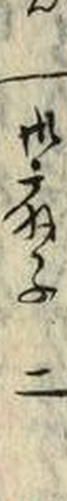御扇子二
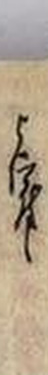被仰付候
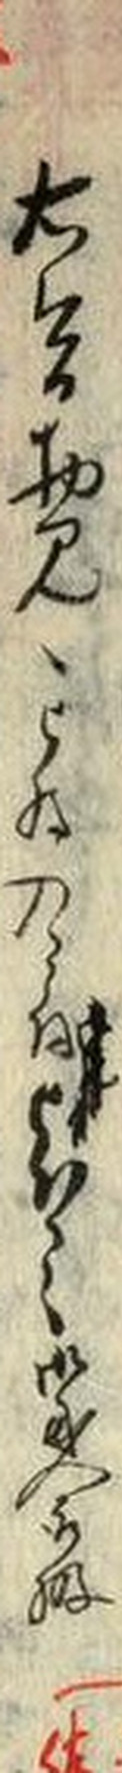右今日物見へ被為入候ニ付被下之御用人取扱
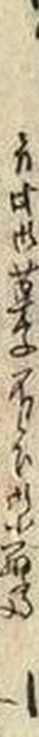ニ付此御菓子不被下御小弁当
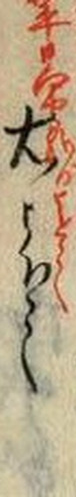右被下之
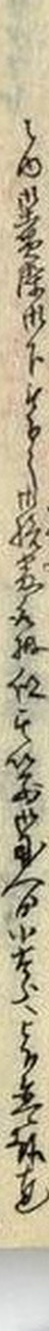之内御煮染御下被下之御膳番取扱但其以前御用人ゟ小太郎へ被下置候趣達有之
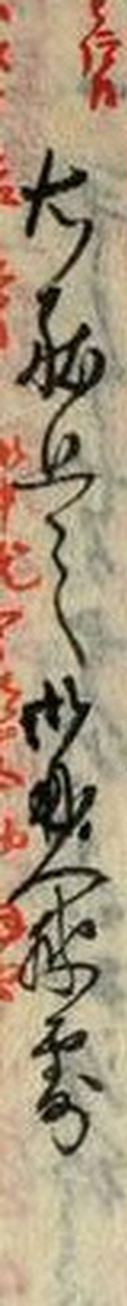右献上之御用人披露

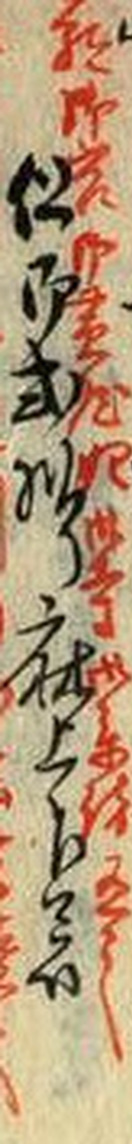但御式掛り麻上下着
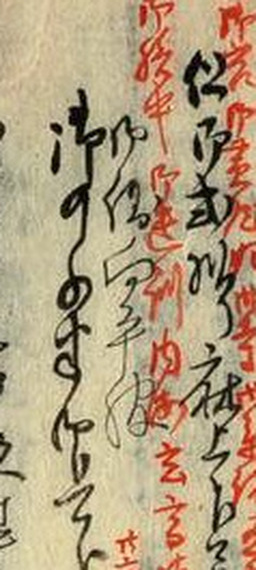御側向平服
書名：少傅日録抄（斉承付側向頭取日記、在国）
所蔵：福井県文書館 Fukui Prefectural Archives
